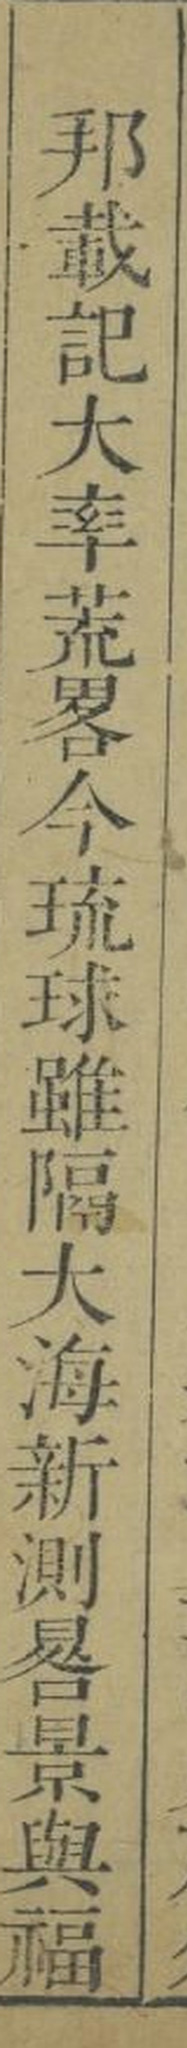邦載記大率荒畧今琉球雖隔大海新測晷景與福
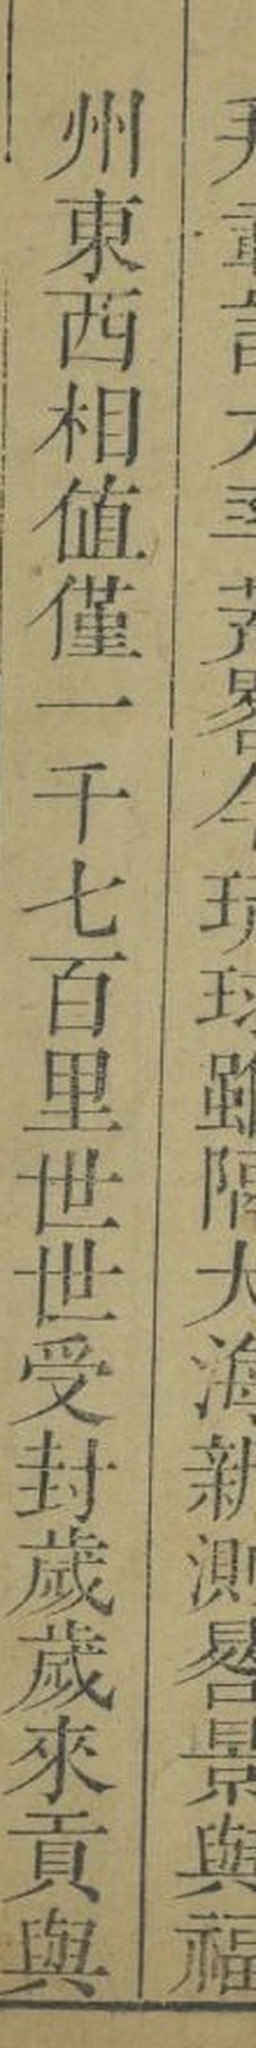州東西相値僅一千七百里世世受封歲歲來貢與
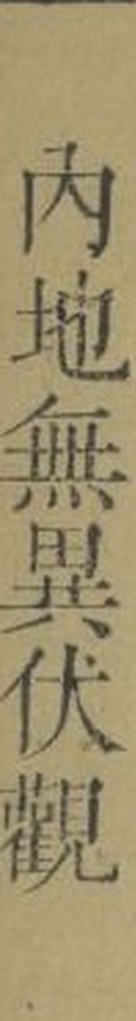内地無異伏觀

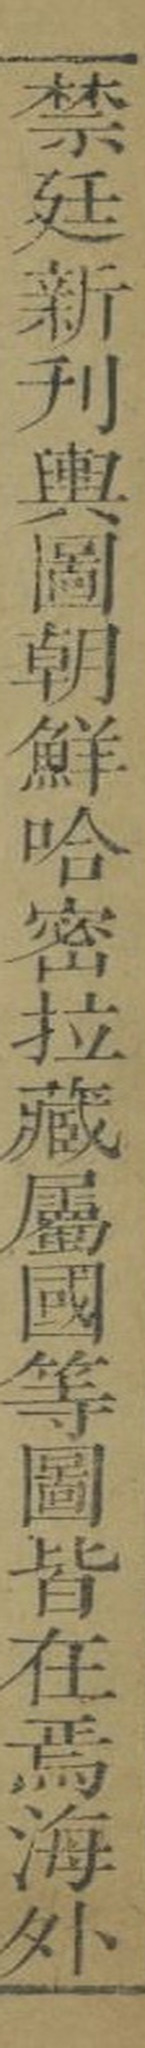禁廷新刊輿圖朝鮮哈密拉藏屬國等圖皆在焉海外
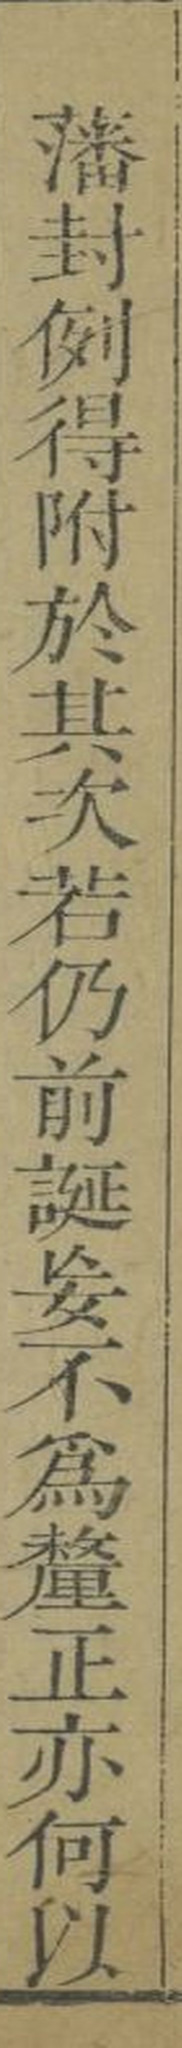藩封例得附於其次若仍前誕妄不爲釐正亦何以
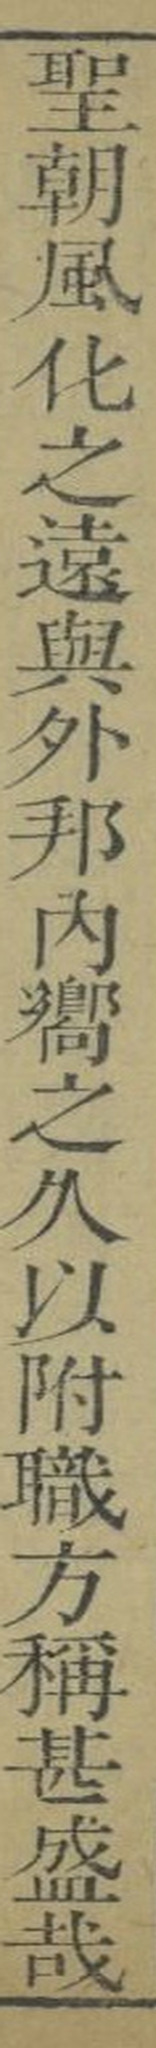聖朝風化之遠與外邦内嚮之久以附職方稱甚盛哉
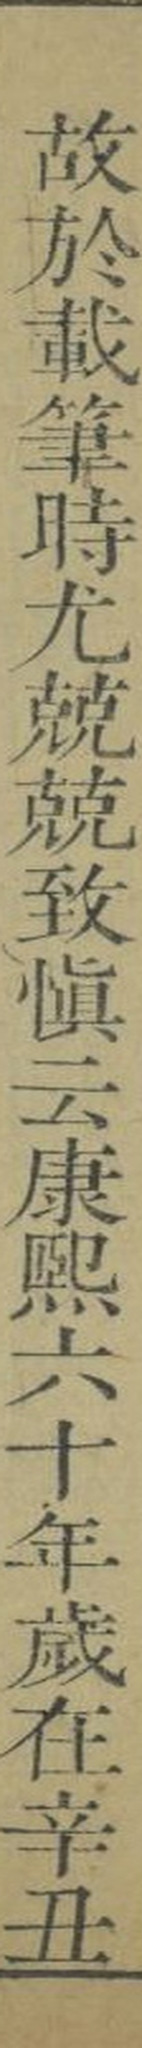故於載筆時尤兢兢致愼云康煕六十年歲在辛丑
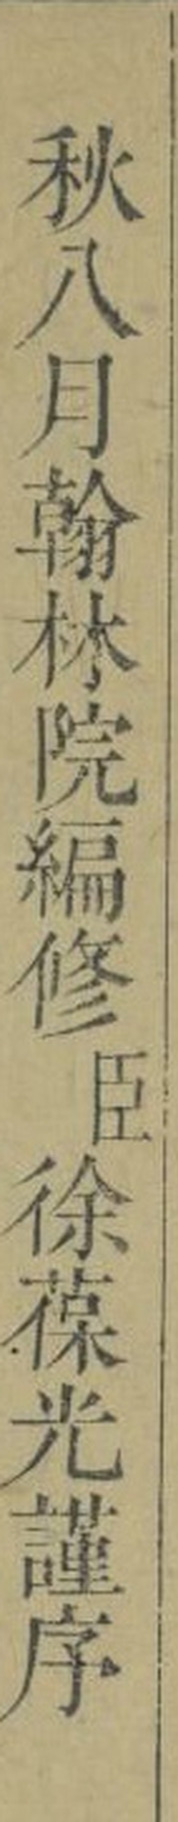秋八月翰林院編修臣徐葆光謹序
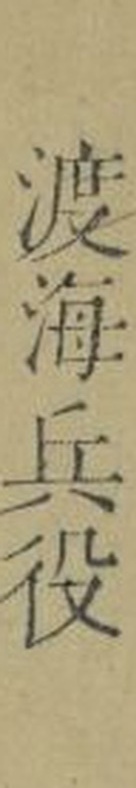渡海兵役
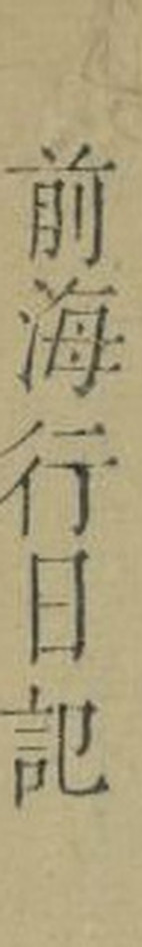前海行日記
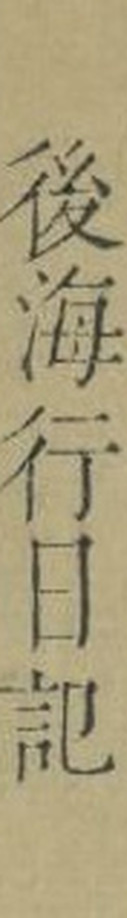後海行日記
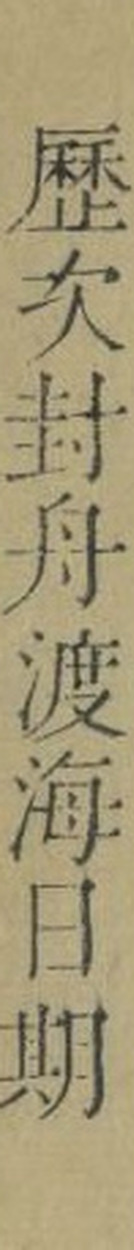歷次封舟渡海日期
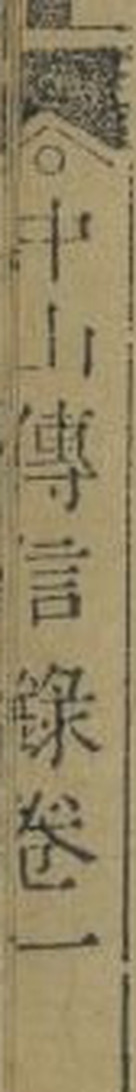中山傳信錄卷第一

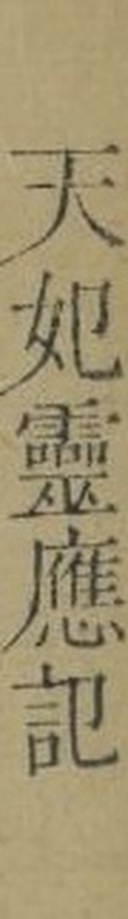天妃靈應記
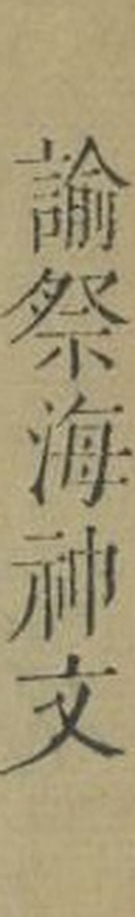諭祭海神文
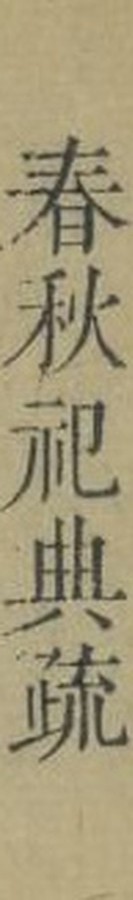春秋祀典疏
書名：中山伝信録 巻一
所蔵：University of the Ryukyus Library
